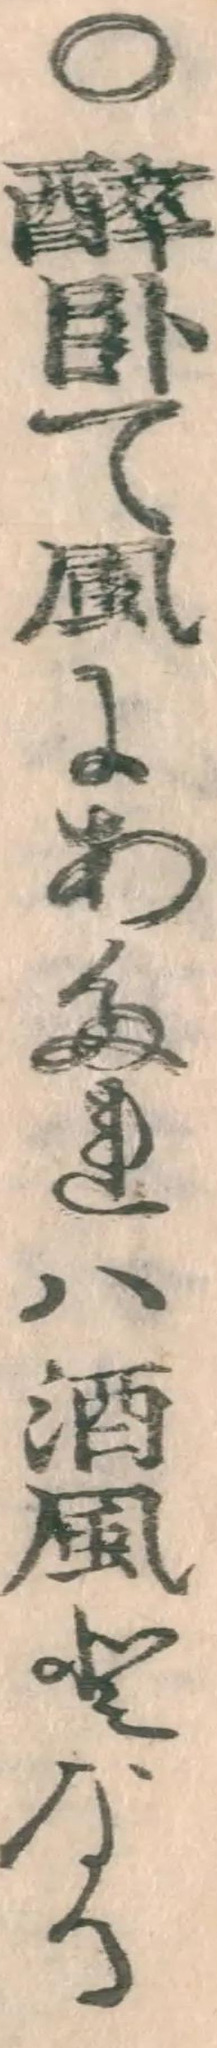〇酔臥て風にあたれは酒風となる
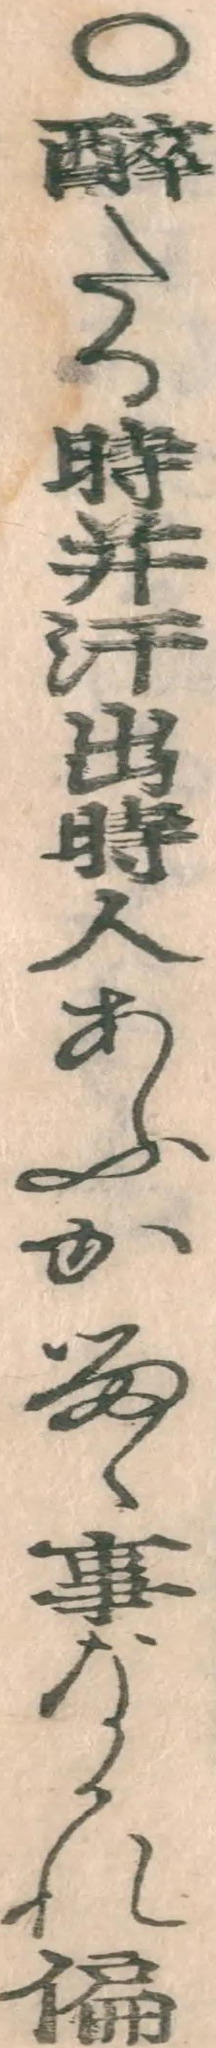〇酔たる時并汗出時人あふかるゝ事なかれ偏
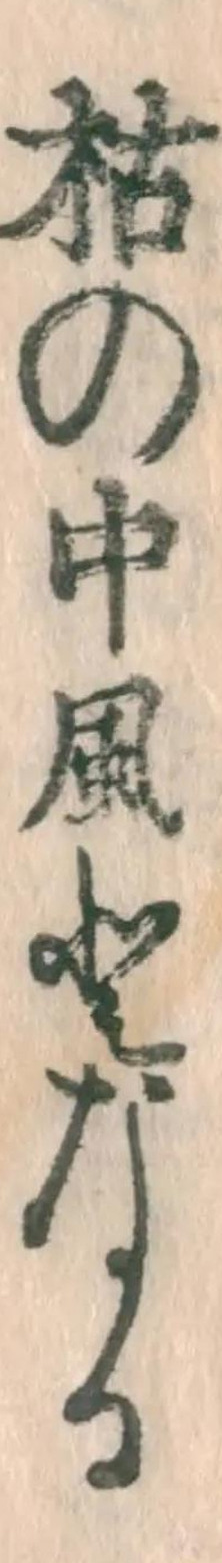枯の中風となる
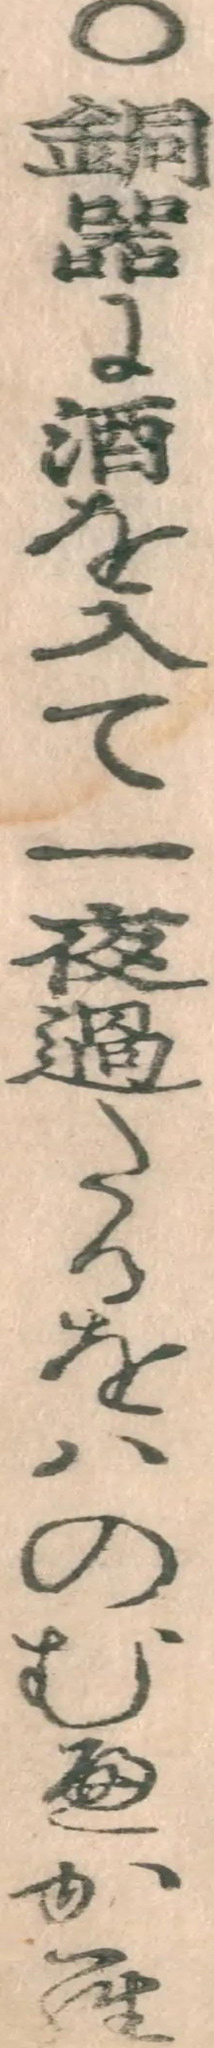〇銅器に酒を入て一夜過たるをはのむへから

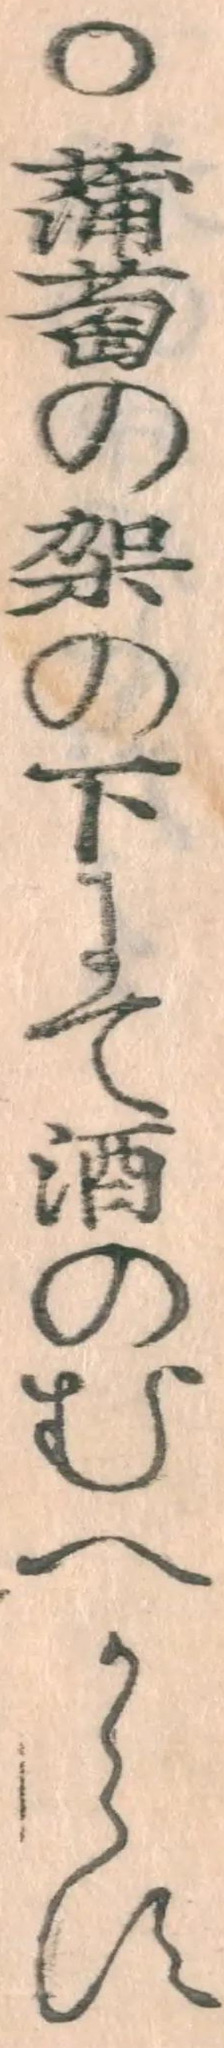〇葡萄の架の下にて酒のむへからす
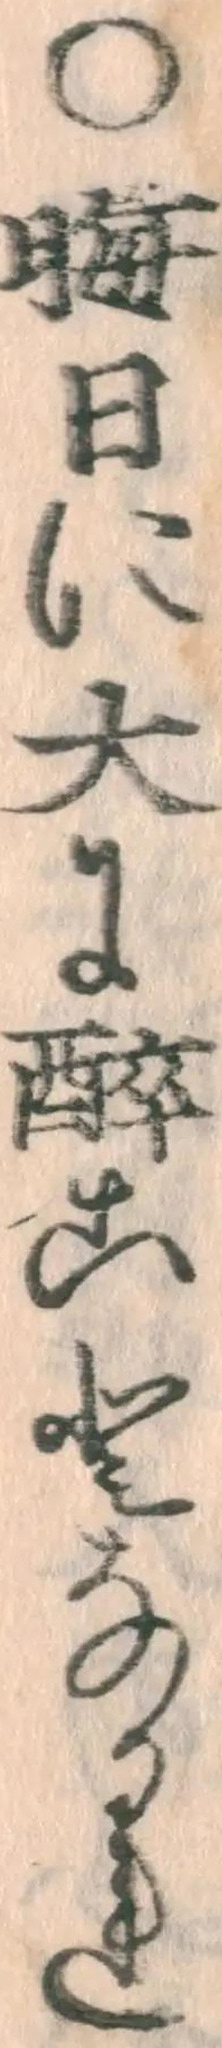〇晦日に大に酔ことなかれ
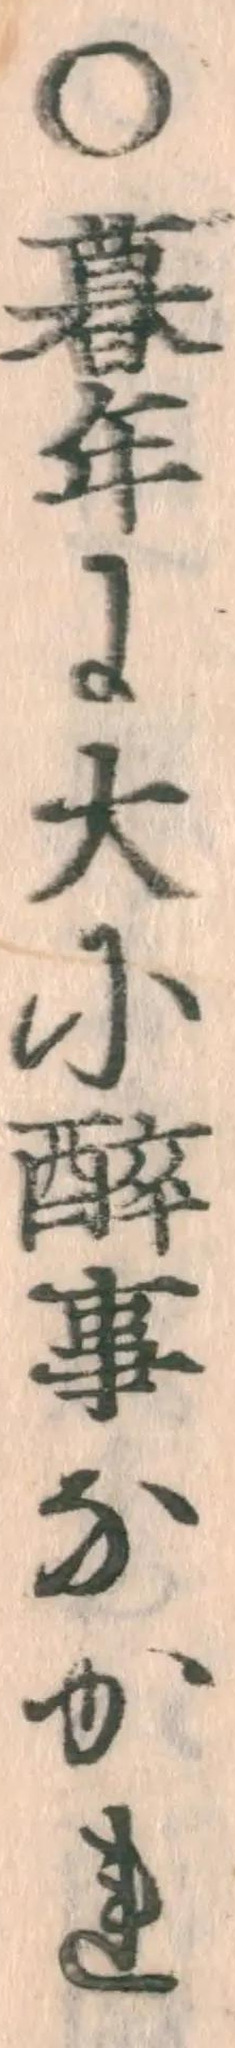〇暮年に大に酔事なかれ
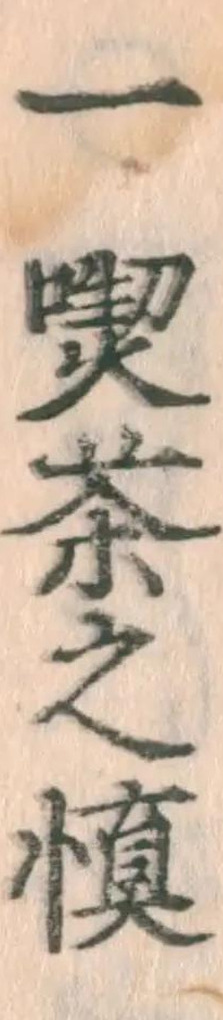一喫茶之慎
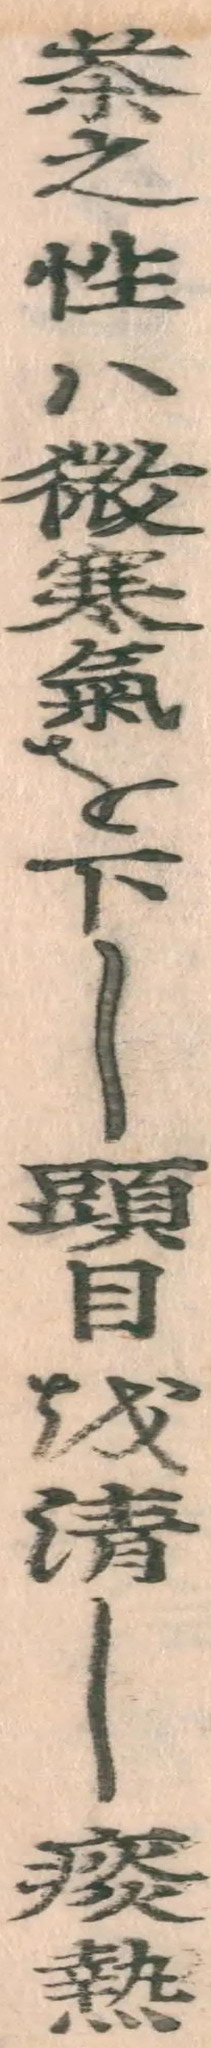茶の性は微寒気を下し頭目を清し痰熱
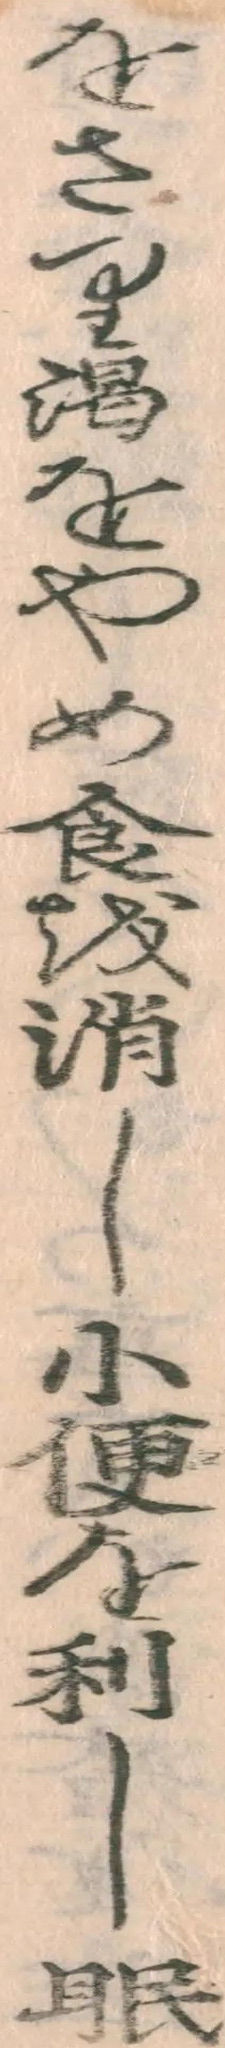をさり渇をやめ食を消し小便を利し眠
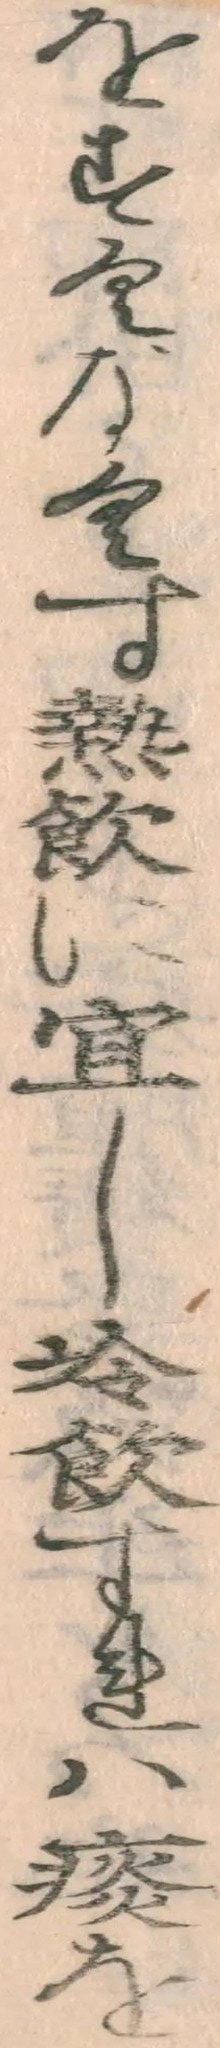をすくなくす熱飲に宜し冷飲すれは痰を
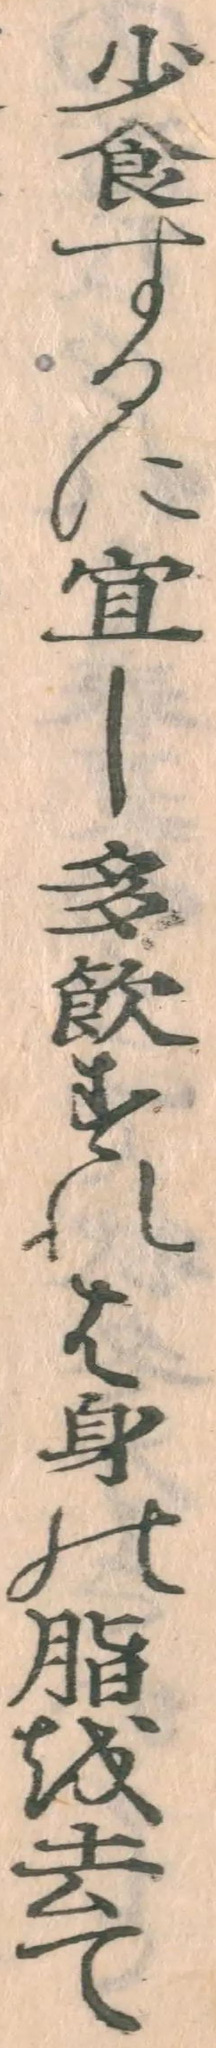少食するに宜し多飲すれは身の脂を去て
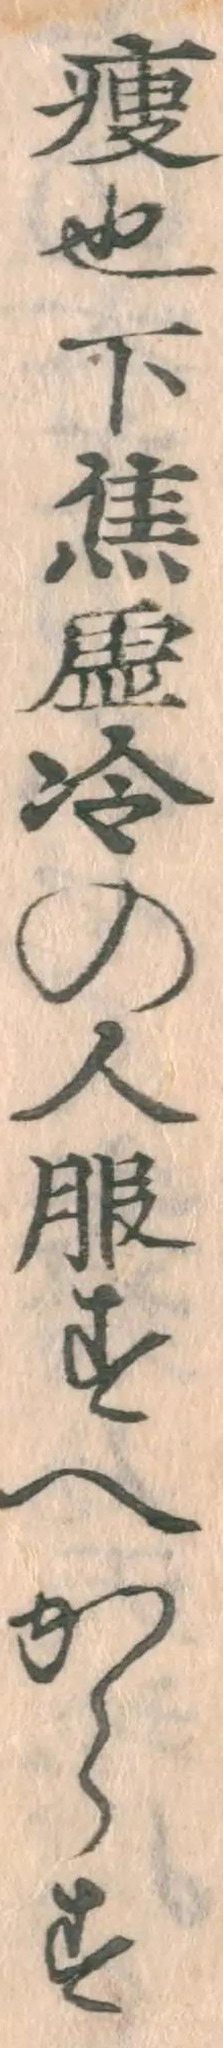痩也下焦虚冷の人服すへからす
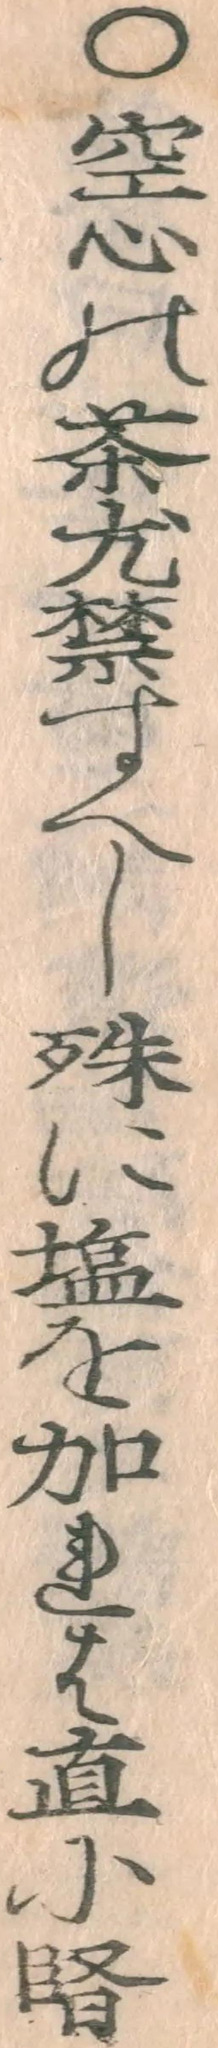〇空心の茶尤禁すへし殊に塩を加れは直に腎
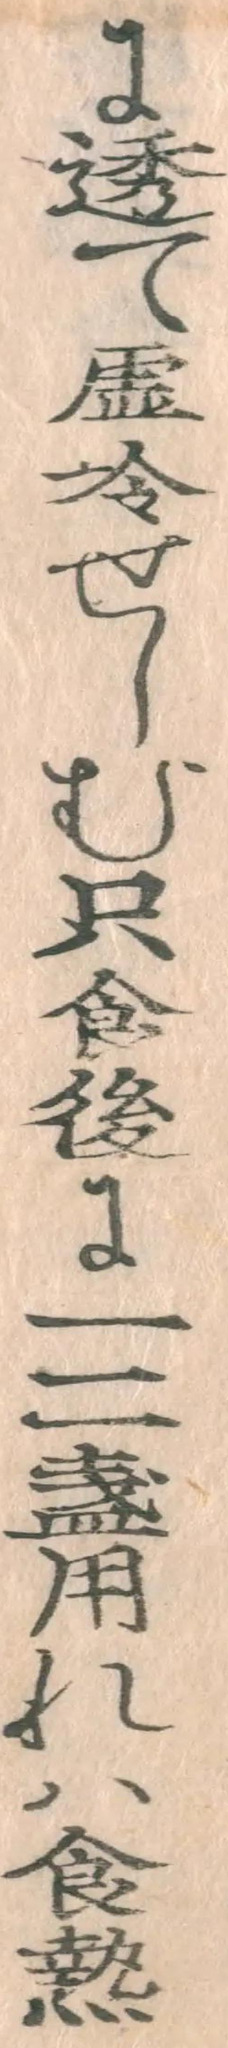に透て虚冷せしむ只食後に一二盞用れは食熱
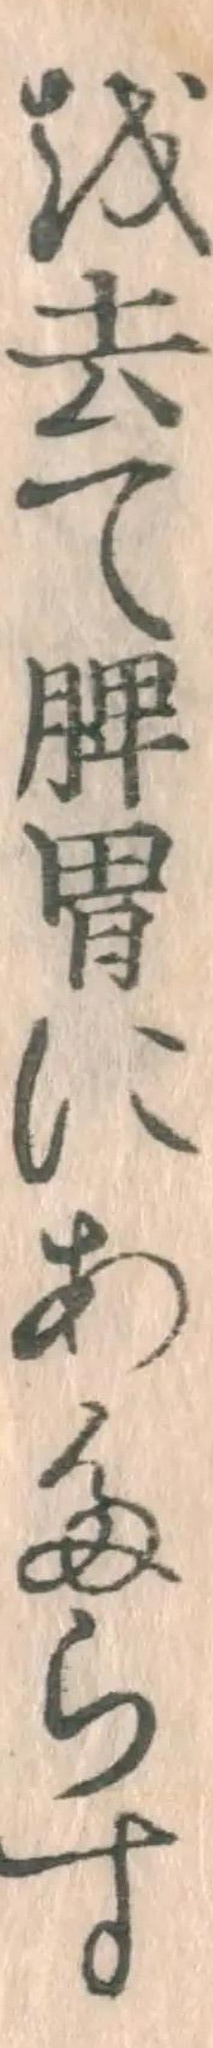を去て脾胃にあたらす
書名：延壽撮要
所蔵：国立国会図書館 National Diet Library, JAPAN
